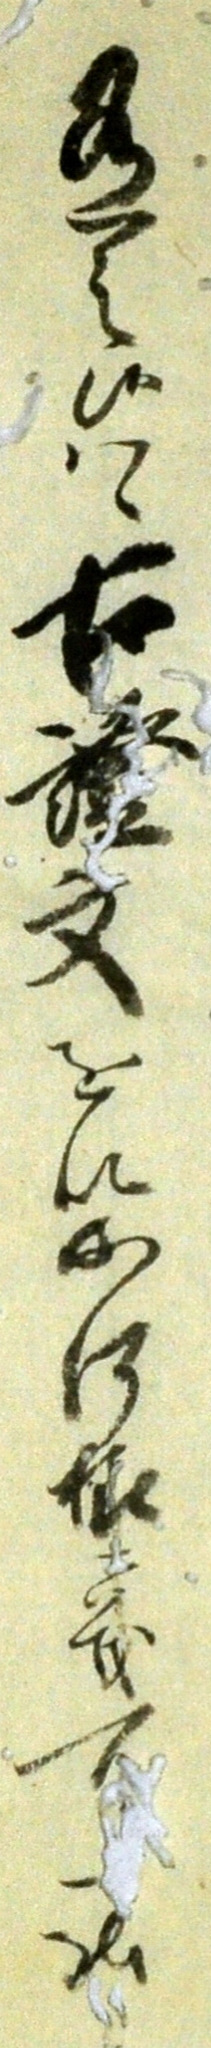有之候はゝ右証文を以如何様にも可被
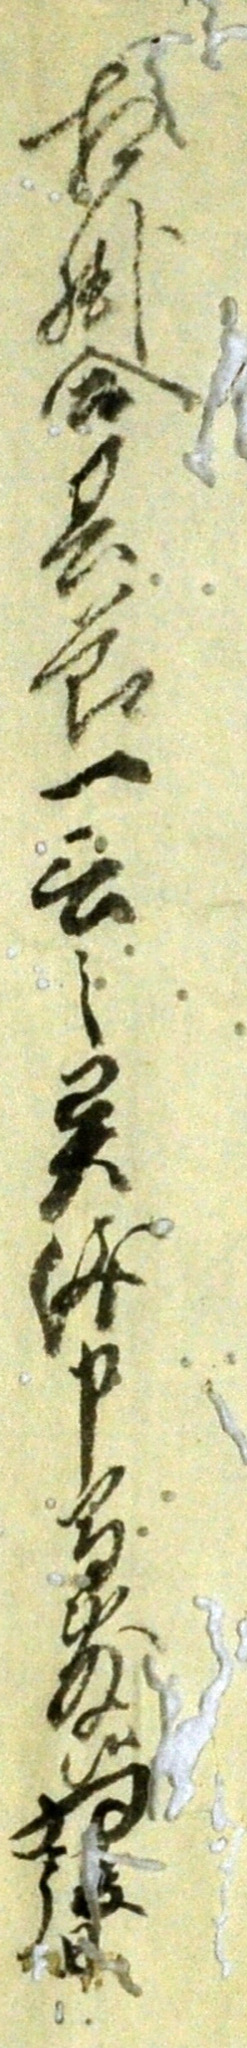相掛合其節一言之異儀申間敷候為後日
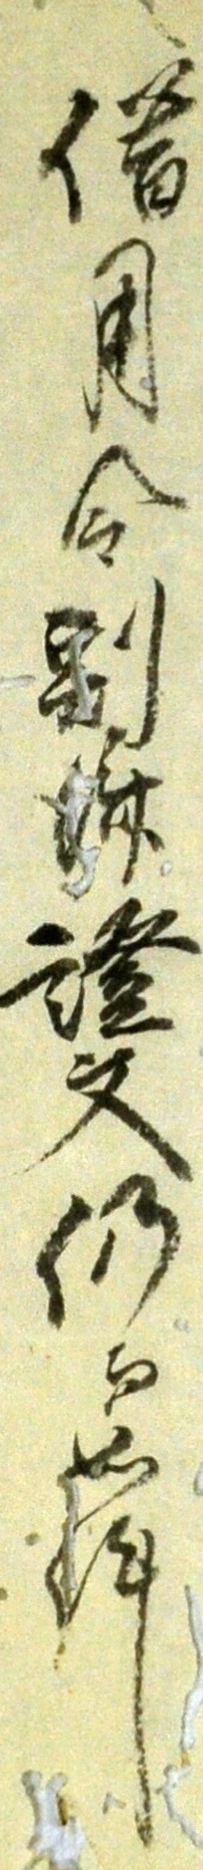借用金割済証文仍て如件
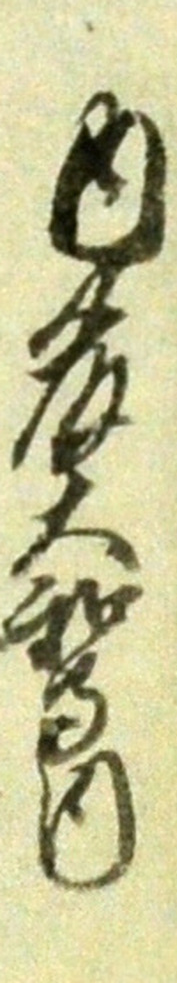内藤大和守内
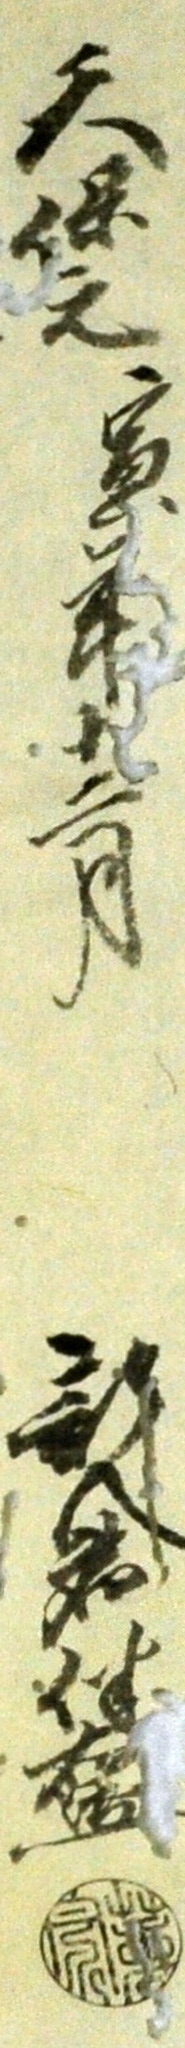天保元寅年十二月新倉伴右衛門㊞
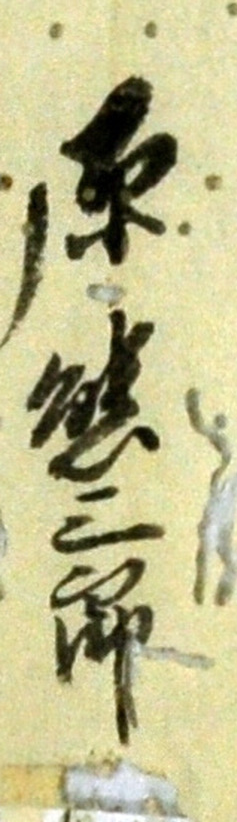原熊三郎
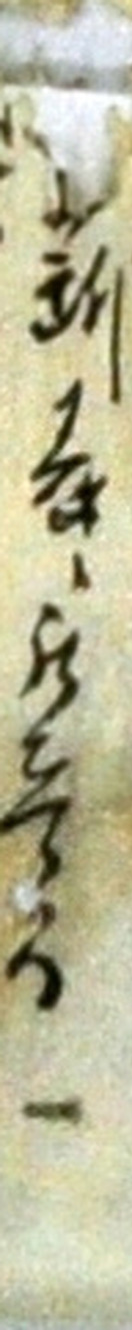所表に罷在候間一
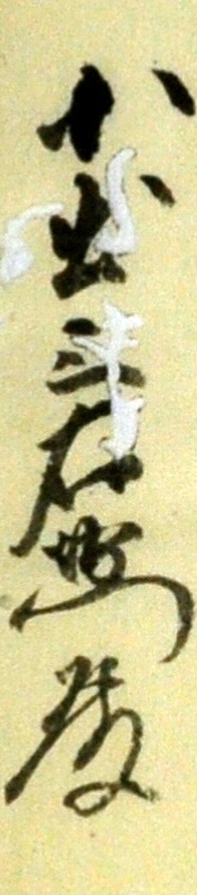小出三右衛門殿
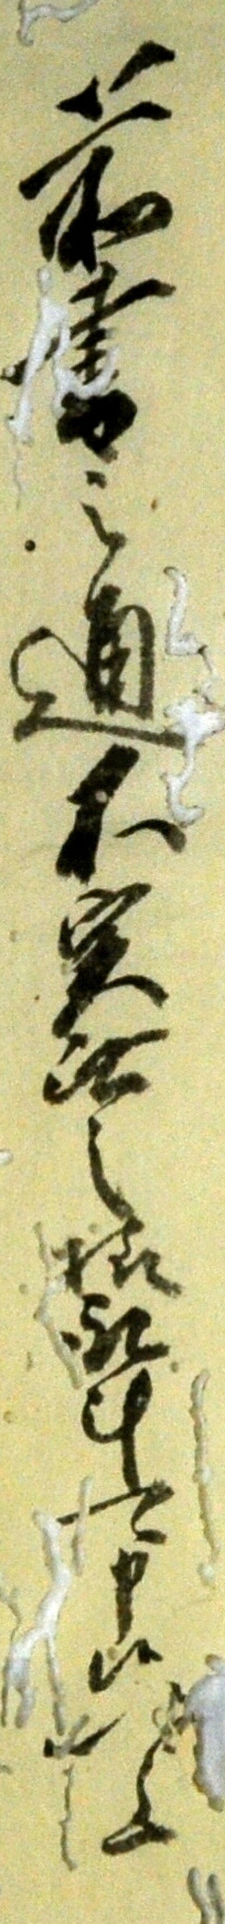前書之通不実無之様取斗可申候以上
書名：借用金証文之事
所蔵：伊那市立高遠町図書館・合同会社AMANE
